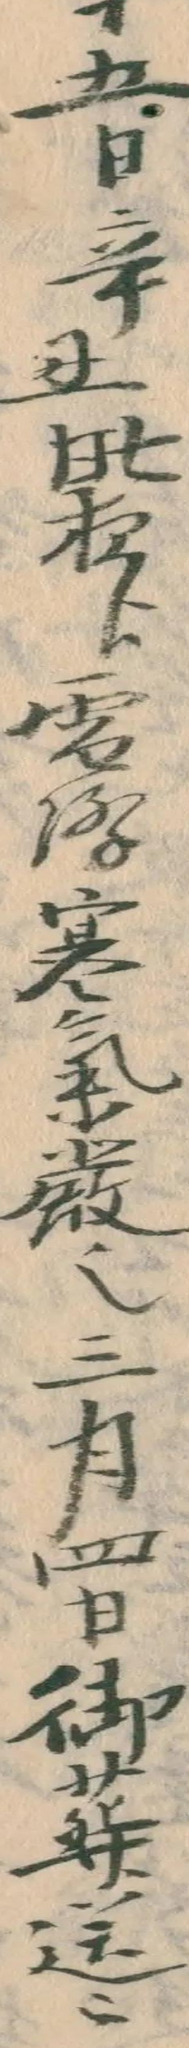十五日辛丑昨夜ゟ雪降寒氣厳也三月四日御葬送ニ
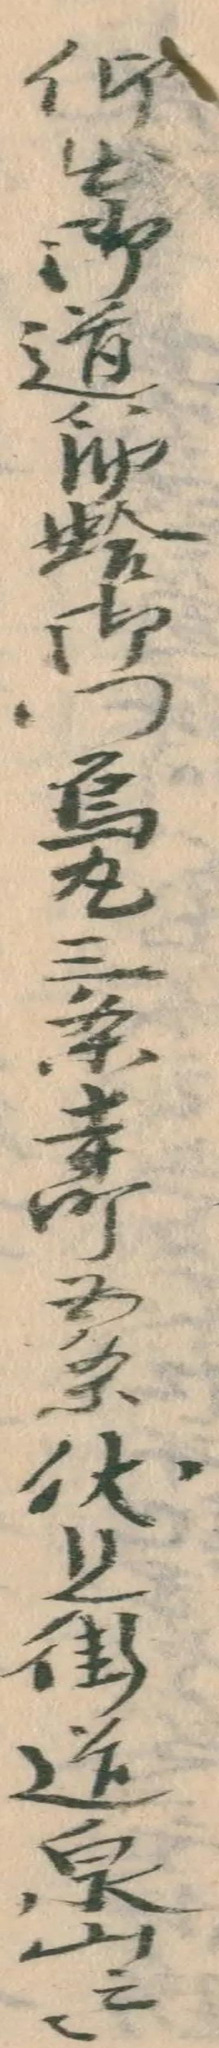仰出御道筋蛤御門烏丸三条寺町五条伏見街道泉山云々
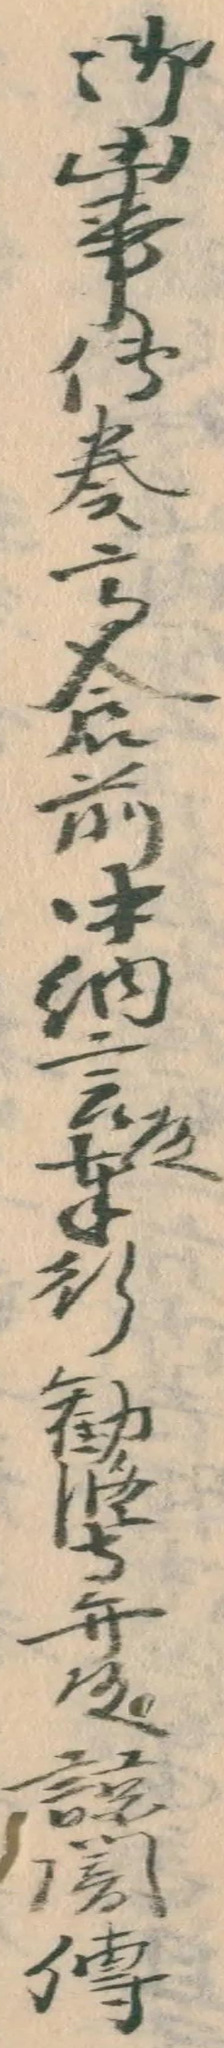御凶事傳奏高倉前中納言殿奉行勧修寺弁殿諒闇傳
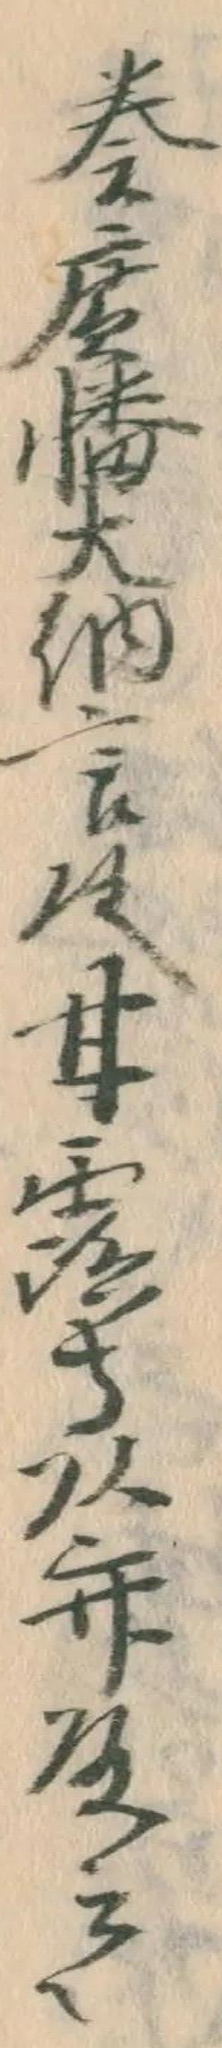奏廣幡大納言殿甘露寺頭弁殿云々
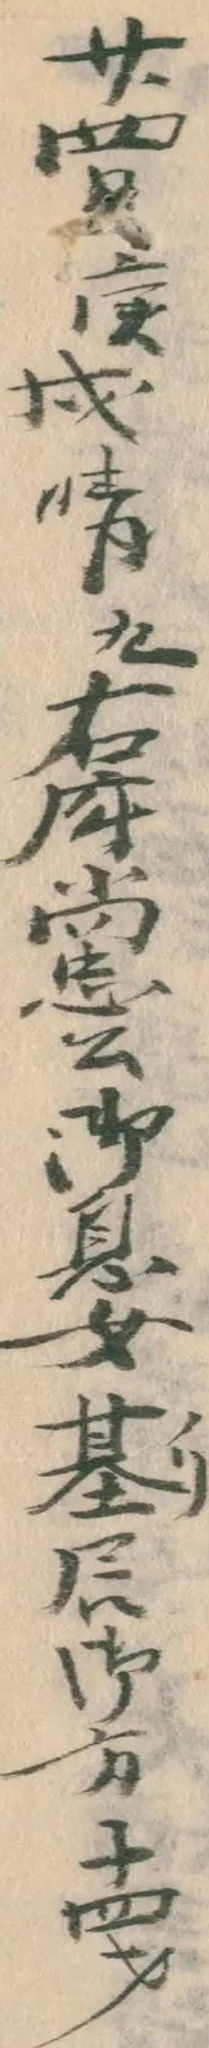廿四日庚戌晴九右府尚忠公御息女基君御方十四才
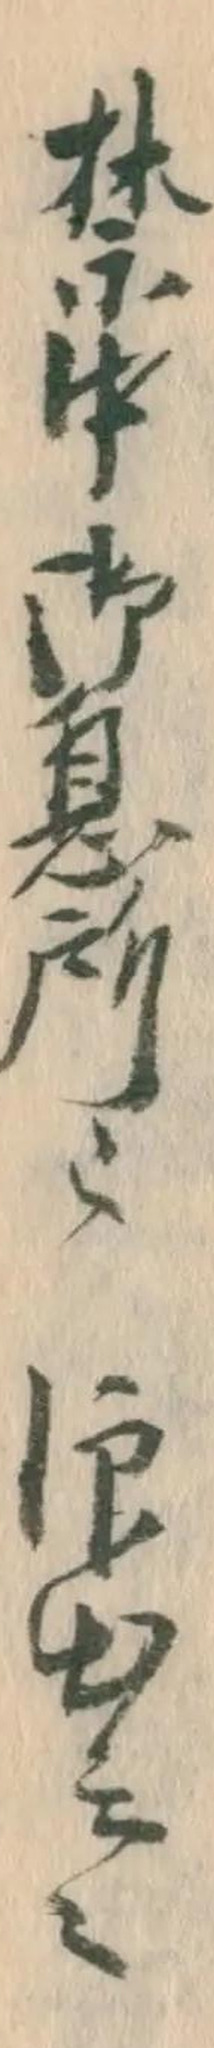禁中御息所被仰出云々

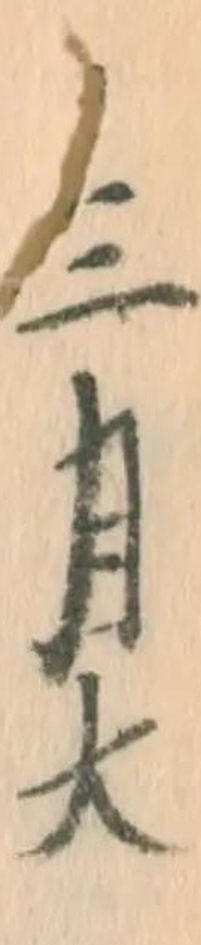三月大
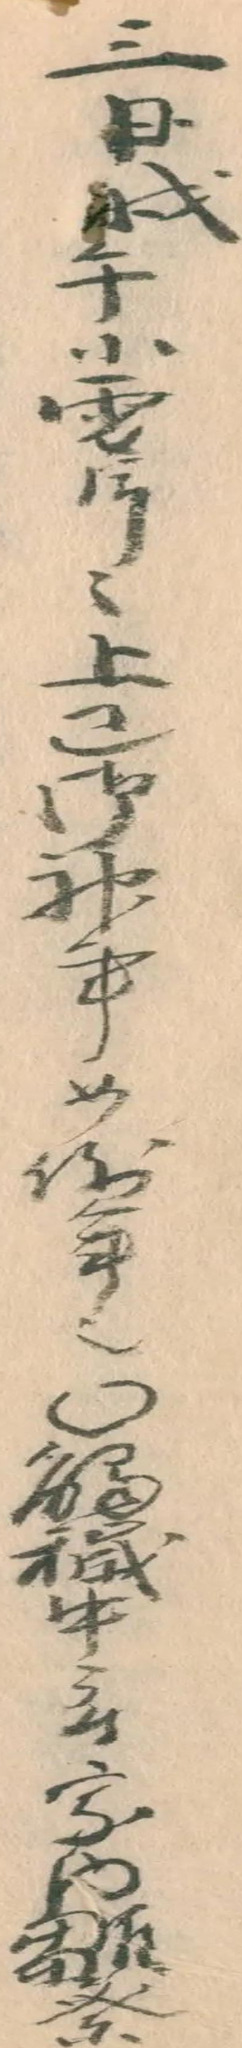三日戊午小雪片々上巳御神事如例年也○觸穢中ニ付家内雛祭
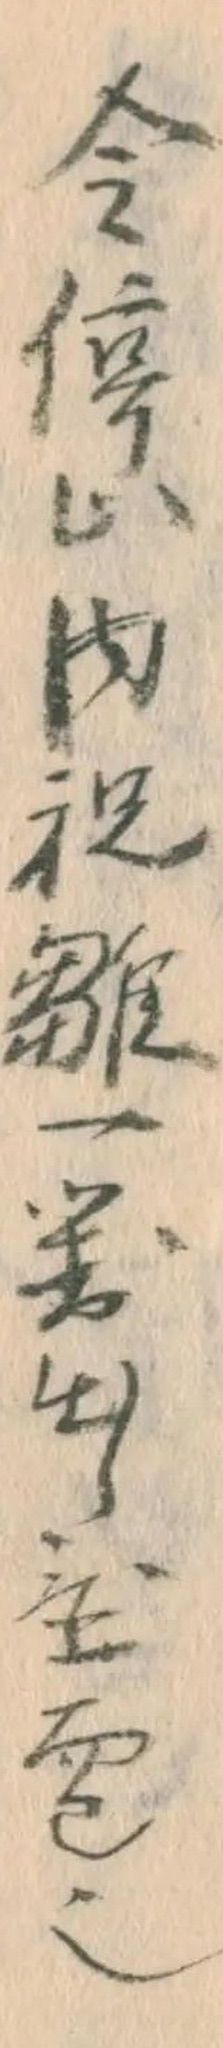令停止内祝雛一對出し置而巳也
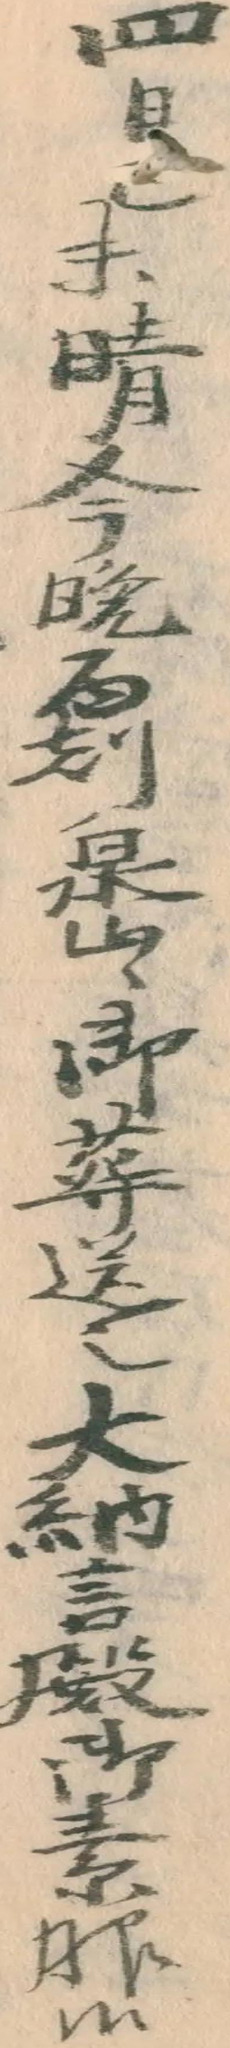四月己未晴今晩酉刻泉山へ御葬送也大納言殿御素服御
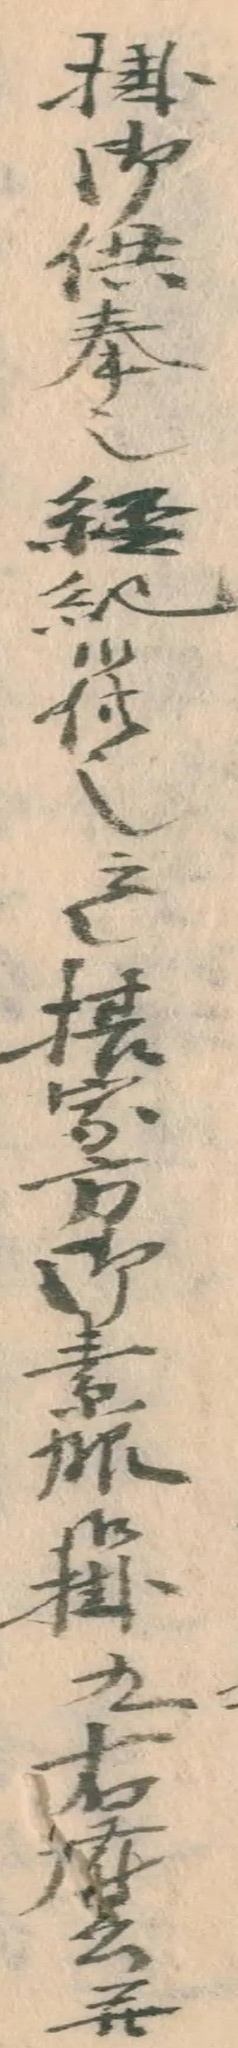掛御供奉也経紀御供也云々摂家方御素服御掛九右府公并
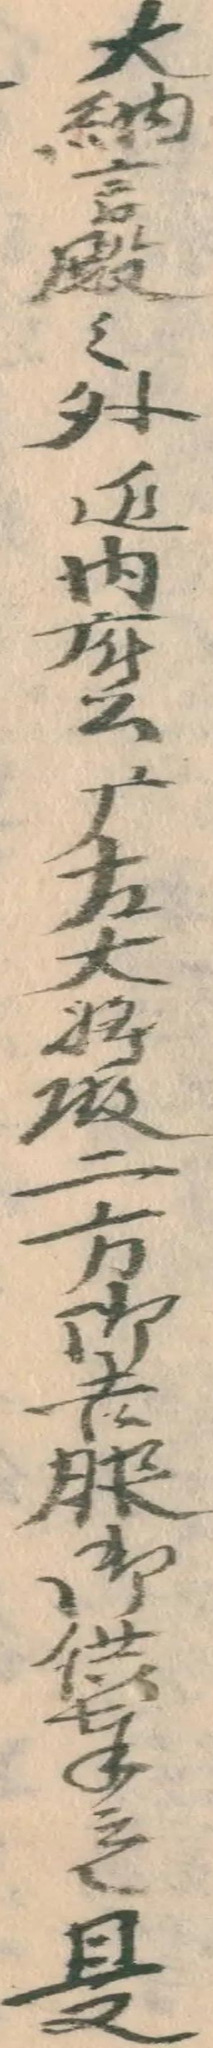大納言殿之外近内府公鷹左大将殿二方御吉服御供奉云々且又
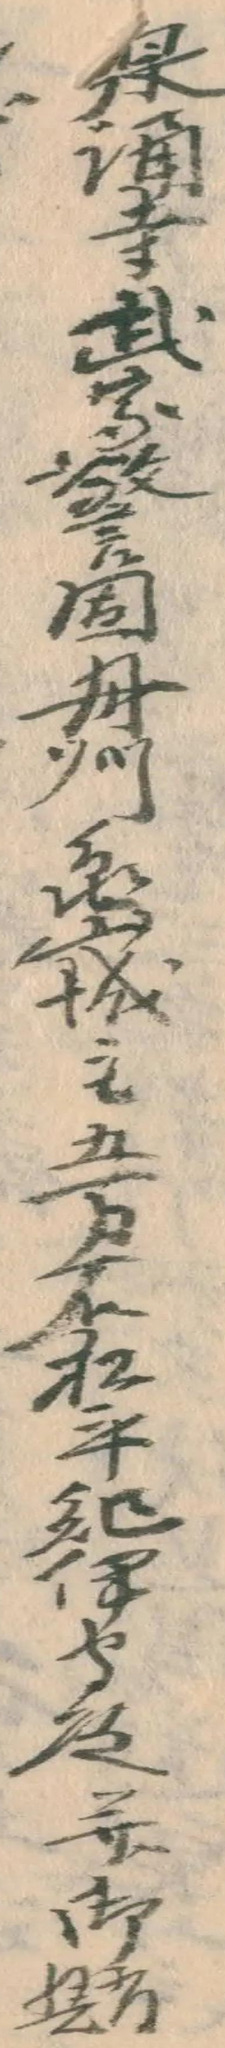泉湧寺武家警固丹州亀山城主五万石松平紀伊守殿并御賄
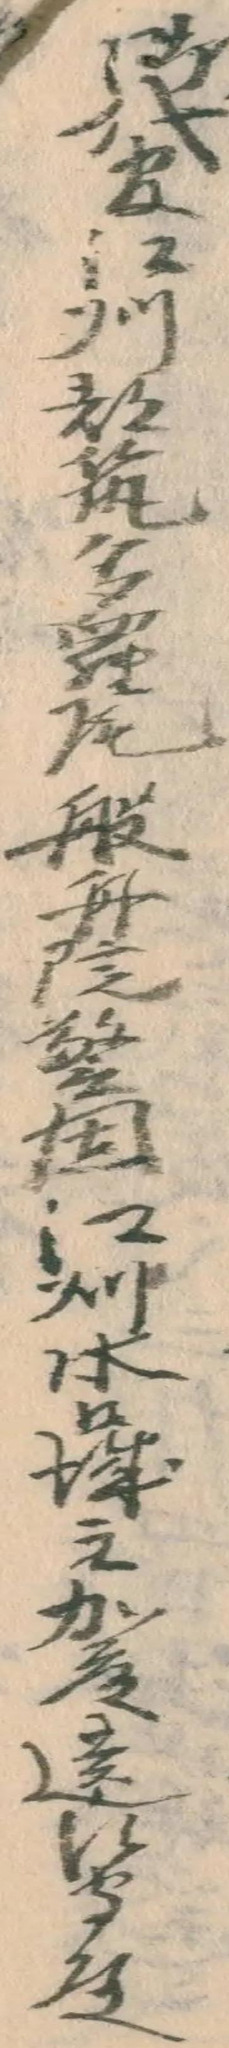御代官江州都筑多羅尾般舟院警固江州水口城主加藤遠江守殿
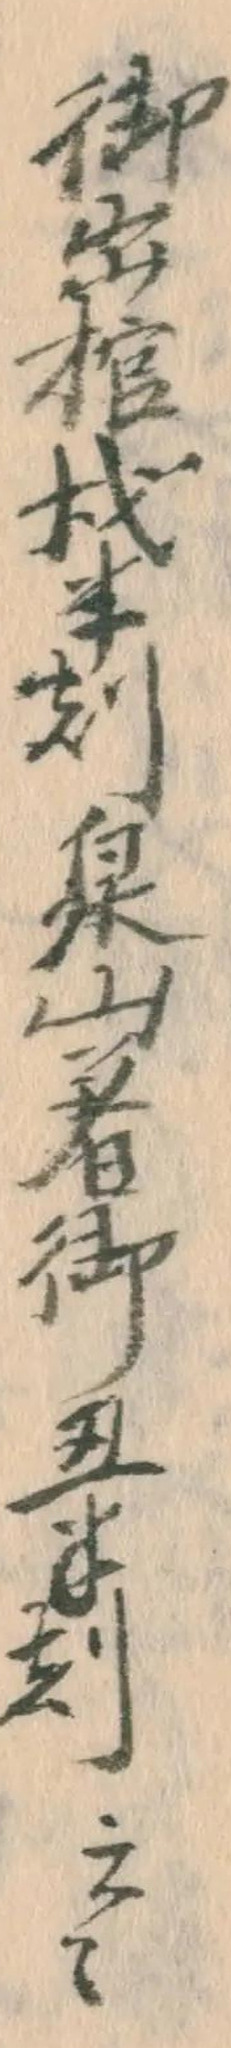御出棺戌半刻泉山着御丑半刻云々
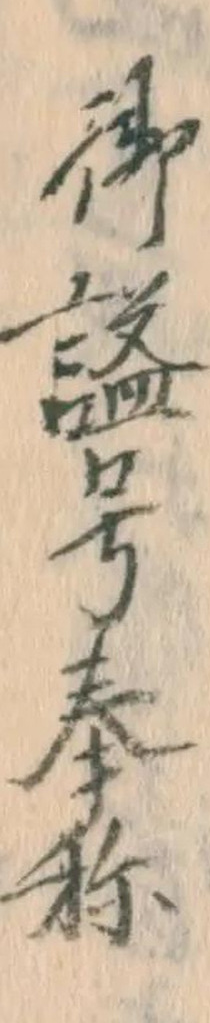御諡号奉称
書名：賀茂社記録. 第70冊
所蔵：国立国会図書館 National Diet Library, JAPAN
